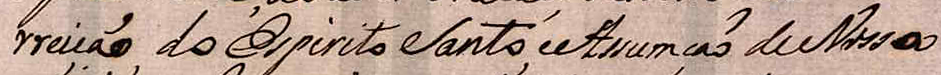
rreiçaõ, do Espirito Santo, e Assumçaõ de Nossa
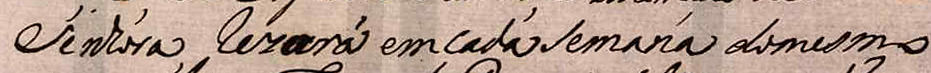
Senhora, rezará em cada semana do mesmo
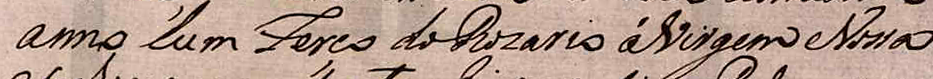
anno hum Terço do Rozario á Virgem Nossa
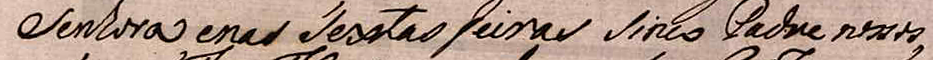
Senhora, e nas sextas feiras sinco Padre nossos,
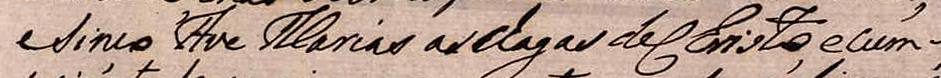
e sinco Ave Marias as chagas de Christo, e cum
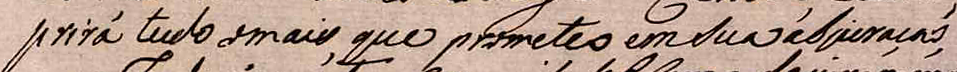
prirá tudo o mais, que prometeo em sua abjuraçaõ,
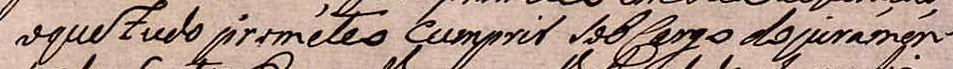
o que tudo prometeo cumprir sob Cargo do juramen
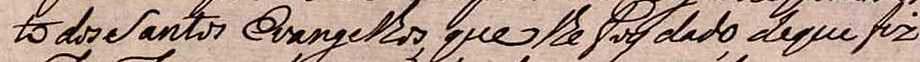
to dos Santos Evangelhos, que lhe foy dado, de que fiz
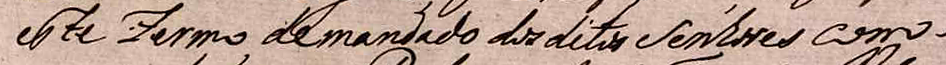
este Termo, de mandado dos ditos senhores com
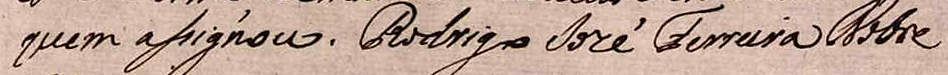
quem assignou. Rodrigo Iozé Ferreira Nobre
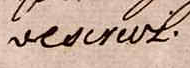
o escrevi.
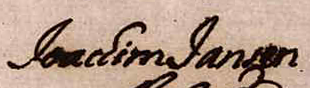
Ioachim Iansen
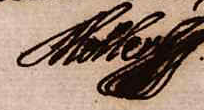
Moller
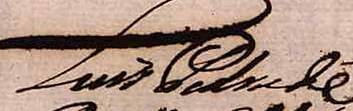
Luis Pedro de
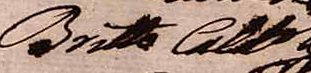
Britto Caldr
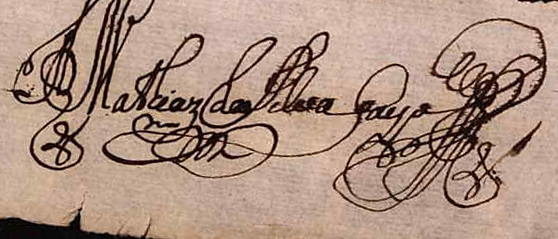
Mathias da Silva Gayo
